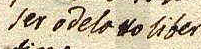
ser o delatto liber
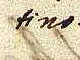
tino.
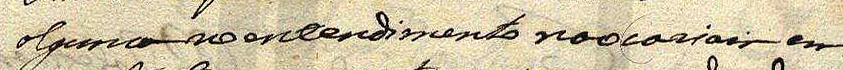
alguma no entendimento na ocaziam em
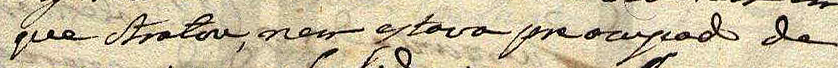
que o tratou, nem estava preocupado de
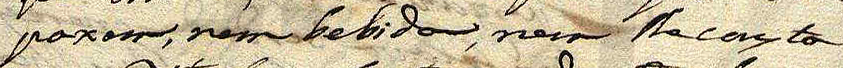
paxam, nem bebida, nem lhe consta
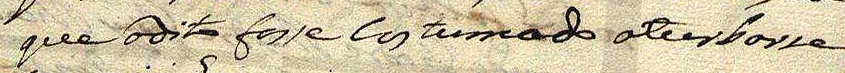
que o dito fosse costumado a turbarse
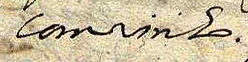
com vinho.
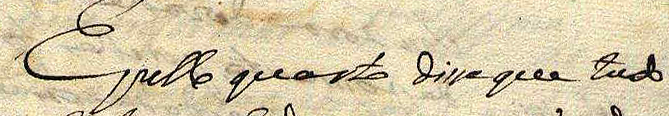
E pello quarto disse que tudo
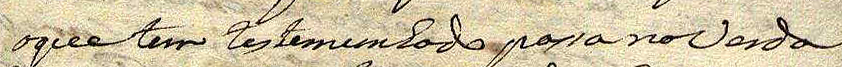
o que tem testemunhado passa na verda
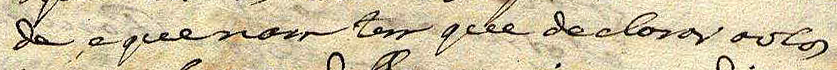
de, e que nam tem que declarar ao cos
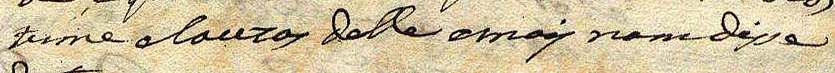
tume e couzas delle e mais nam disse
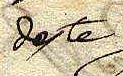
deste
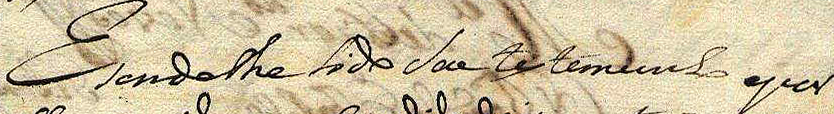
E sendolhe lido Seu testemunho e por
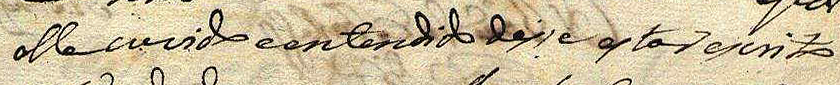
elle ouvido, e entendido disse estar escrito
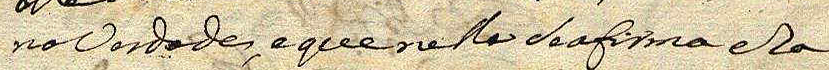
na Verdade, e que nella se afirma e Ra
